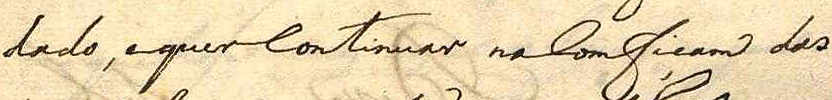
dado, e quer continuar na Comfiçam das
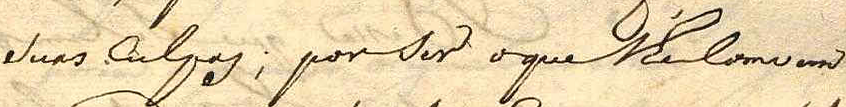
suas Culpas; por ser o que lhe Comvem
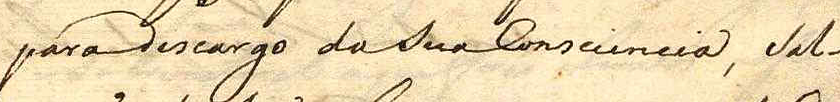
para descargo da Sua Consciencia, sal
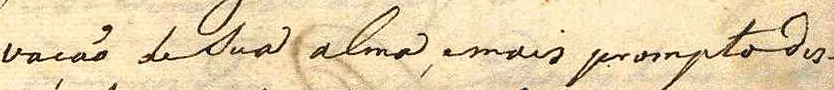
vaçaõ de Sua alma, e mais prompto des
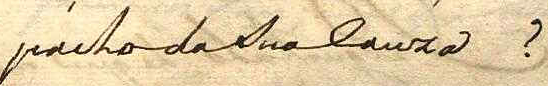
pacho da Sua Cauza?
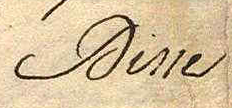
Disse
